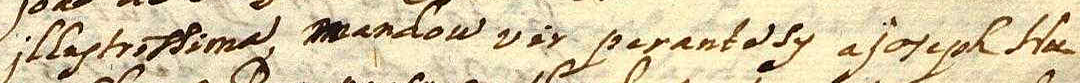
jllustrissima, mandou vir perante sy a joseph Nu
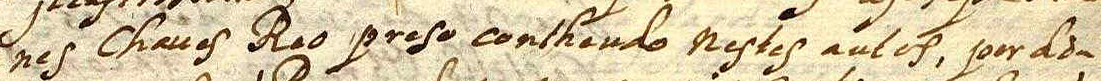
nes Chaues Reo preso contheudo nestes autos, por di
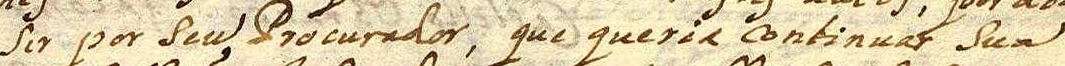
ser por seu Procurador, que queria continuar sua
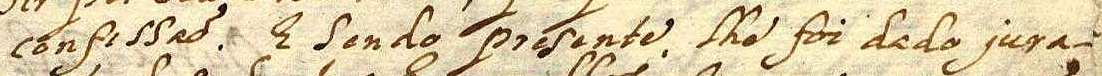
confissaõ. E sendo presente lhe foi dado jura
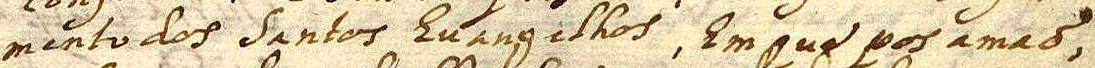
mento dos Santos Euangelhos, Em que pos a maõ,
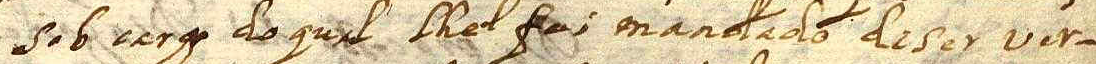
sob cargo do qual lhe foi mandado diser ver
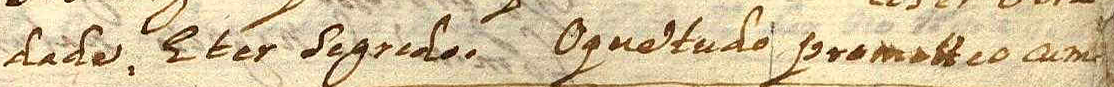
dade, E ter segredo. O que tudo prometteo cum
